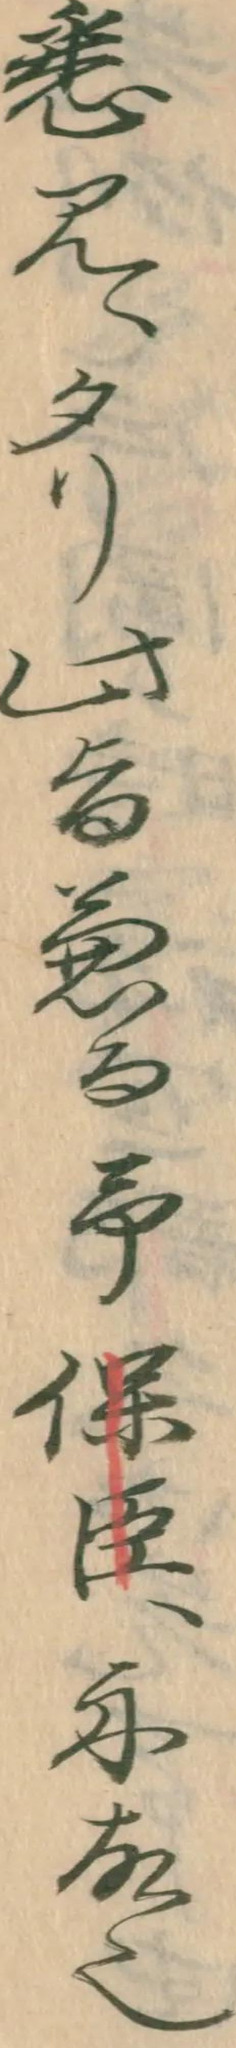悉見へタリ此旨兼而予保臣ヘ示故也
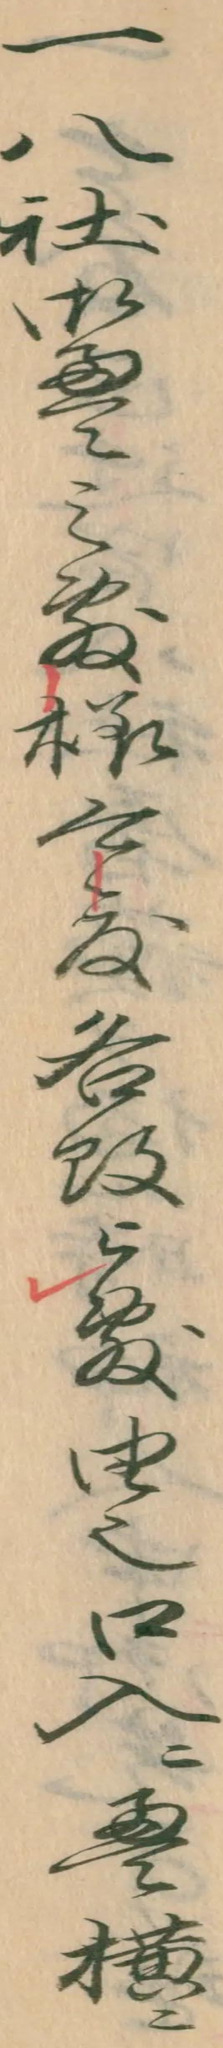一八社御畳之敷_様今-度各改被敷由也口入ニ畳横ニ
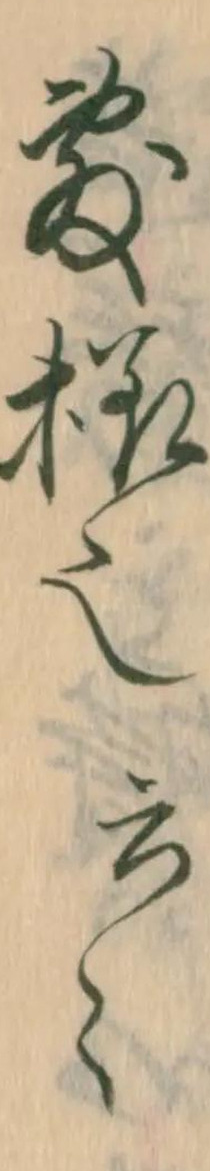敷様也云々

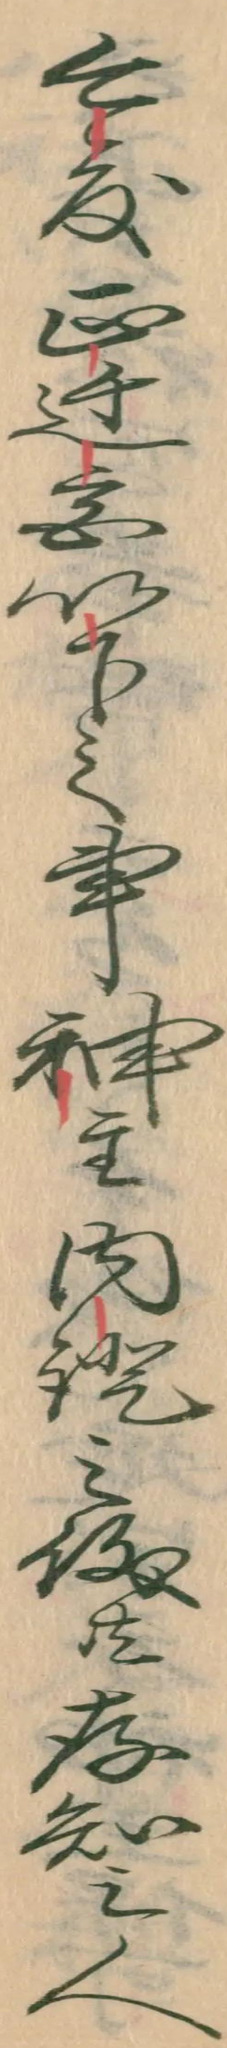今-度正-迁-宮以-下之事神_主内-証之儀共存知之人
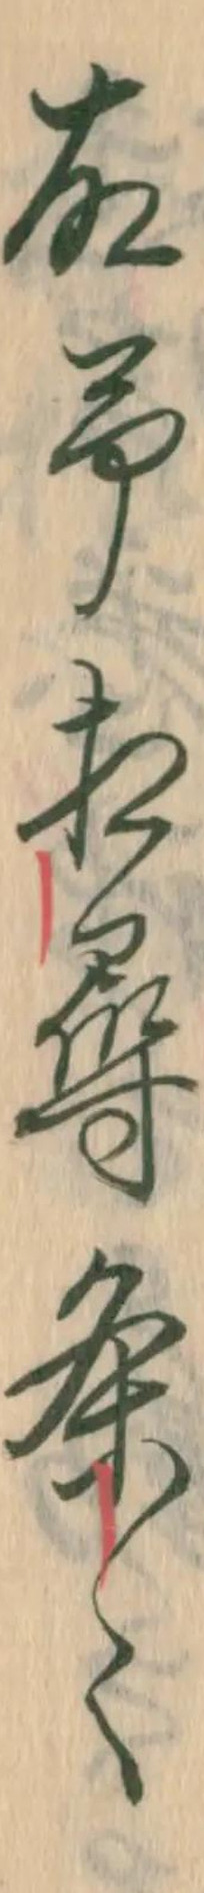故予相_尋条-々
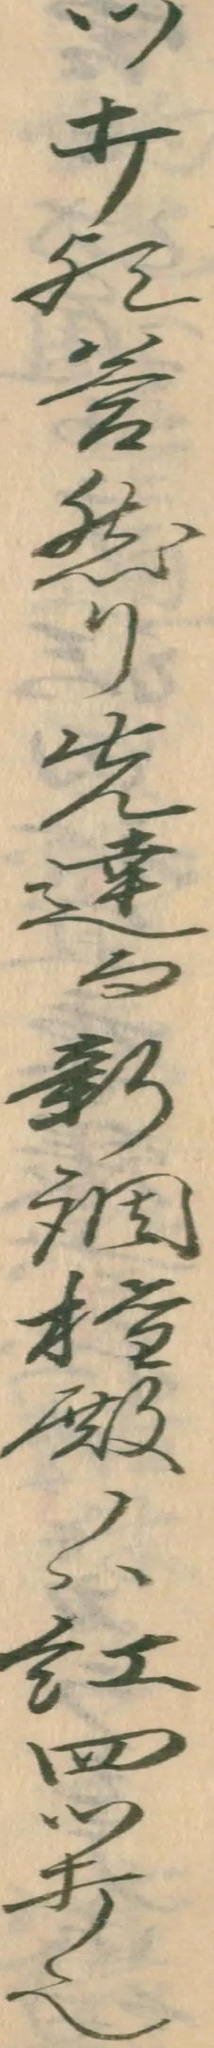ツ打歟答然リ先達而新調権殿ノハ紅四ツ打也
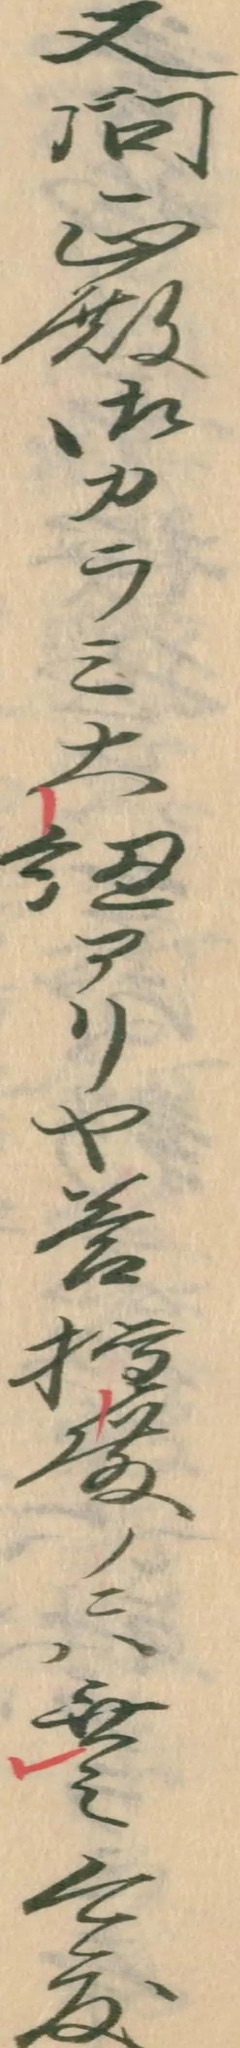又問正殿御カラミ大_紐アリヤ答権-殿ノニハ無之今度
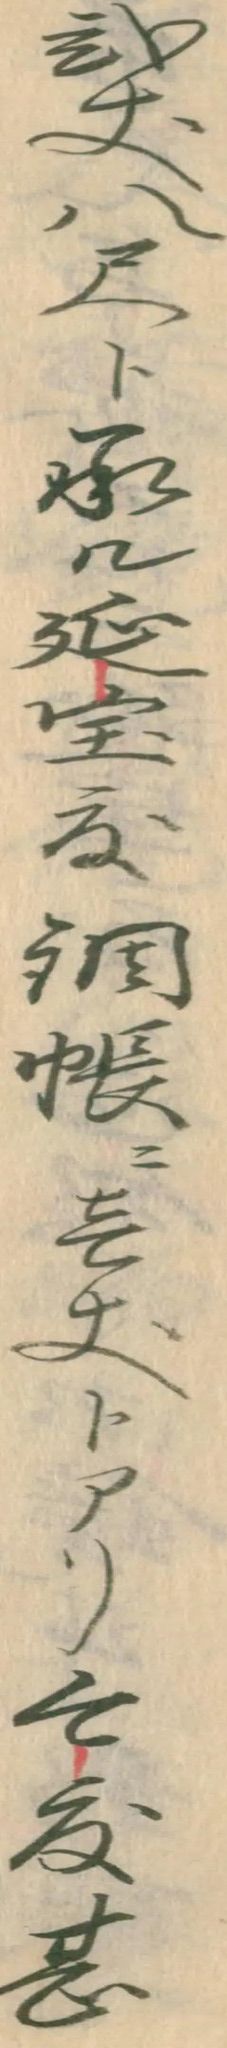弐丈八尺ト承ル延-宝度調帳ニ壱丈トアリ今-度甚
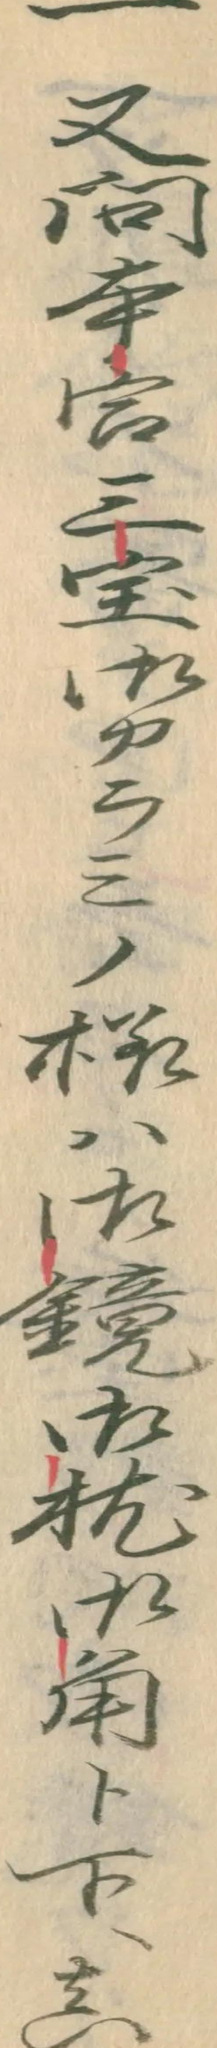一又問本-宮三-宝御カラミノ様ハ御_鏡御_枕御_角ト下へ真
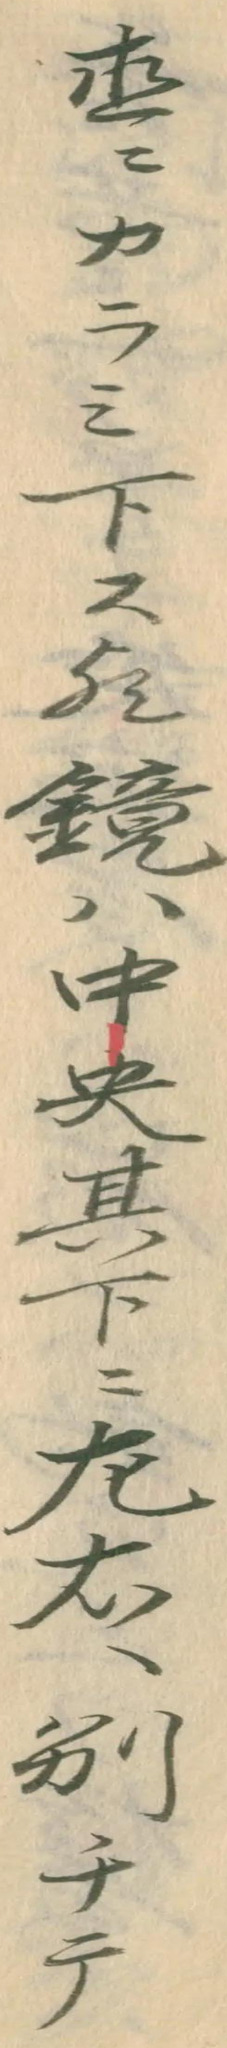直ニカラミ下ス歟鏡ハ中-央其下ニ左右へ別チテ
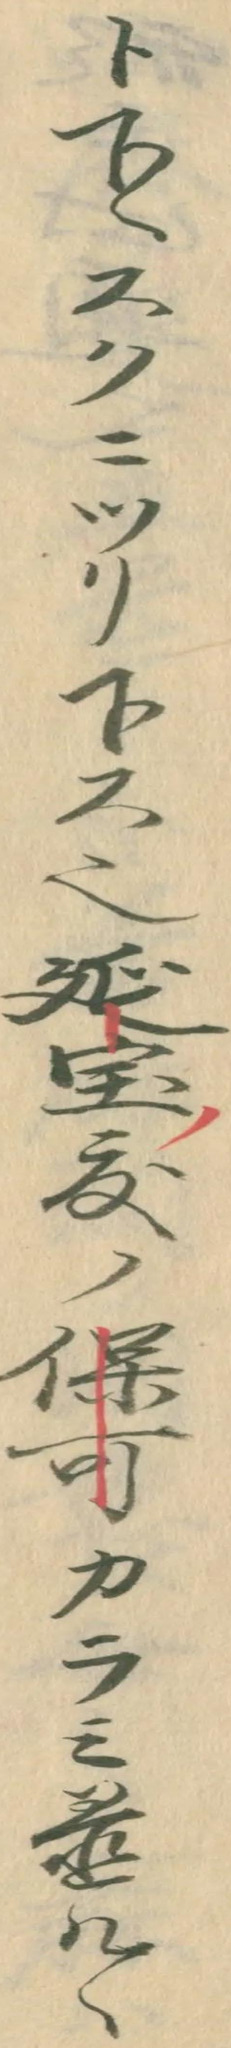ト下へスクニツリ下ス也延-宝度ノ保可カラミ置ルヽ

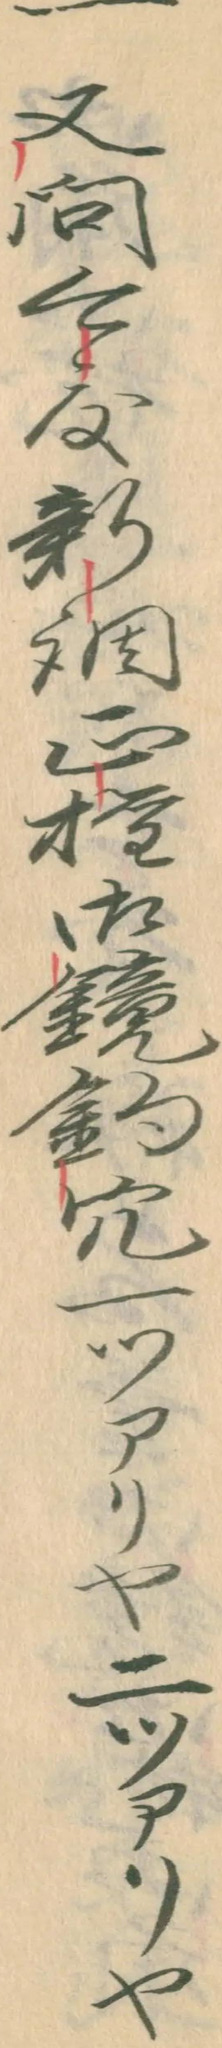一又_問今-度新-調正-権御_鏡釣_穴一ツアリヤ二ツアリヤ
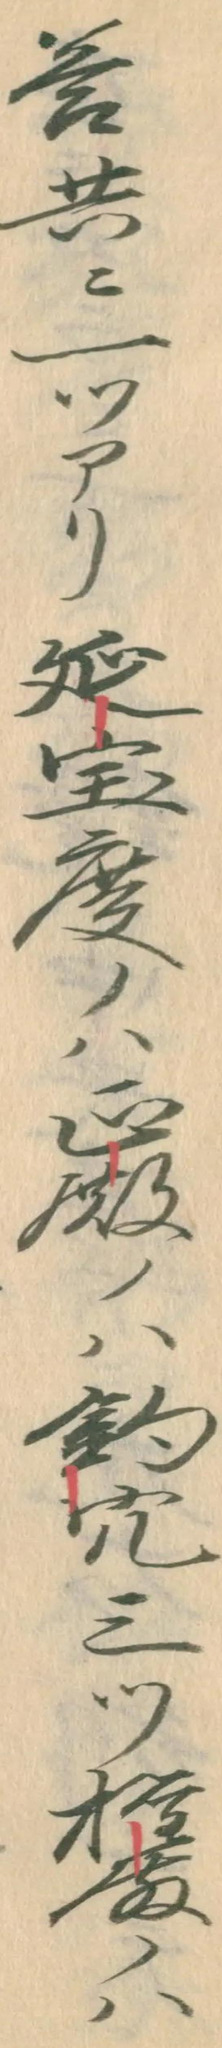答共ニ一ツアリ延-宝度ノハ正-殿ノハ釣_穴三ツ権-殿ノハ
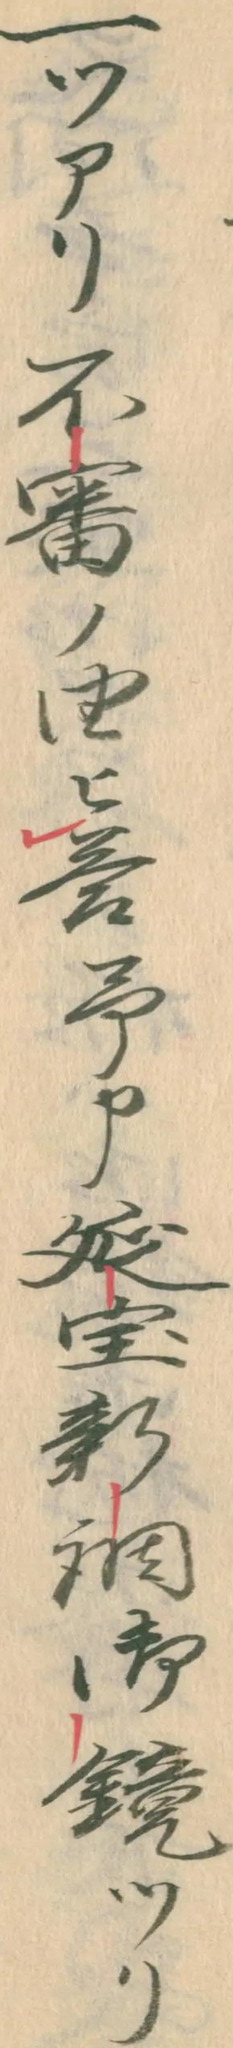一ツアリ不-審ノ由被答予申延-宝新-調御_鏡ツリ
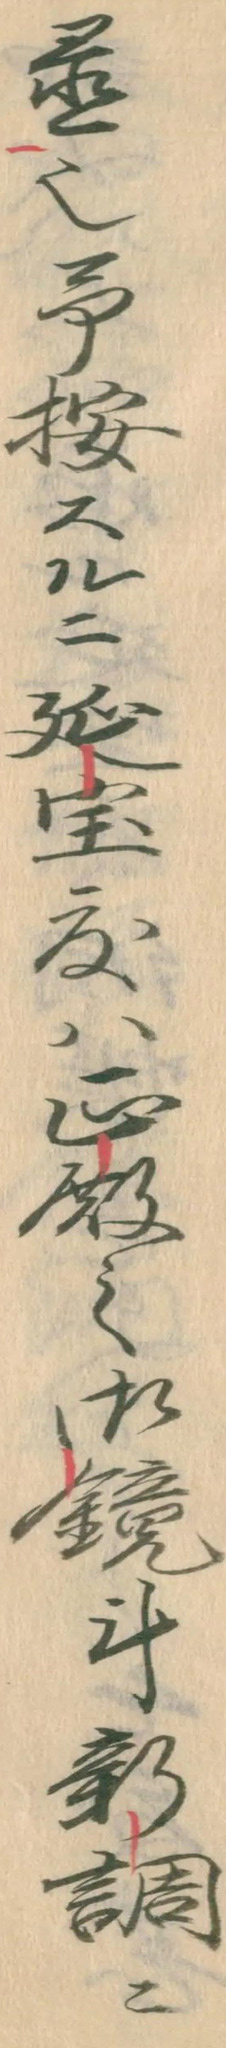置也予按スルニ延-宝度ハ正-殿之御_鏡計新-調ニ
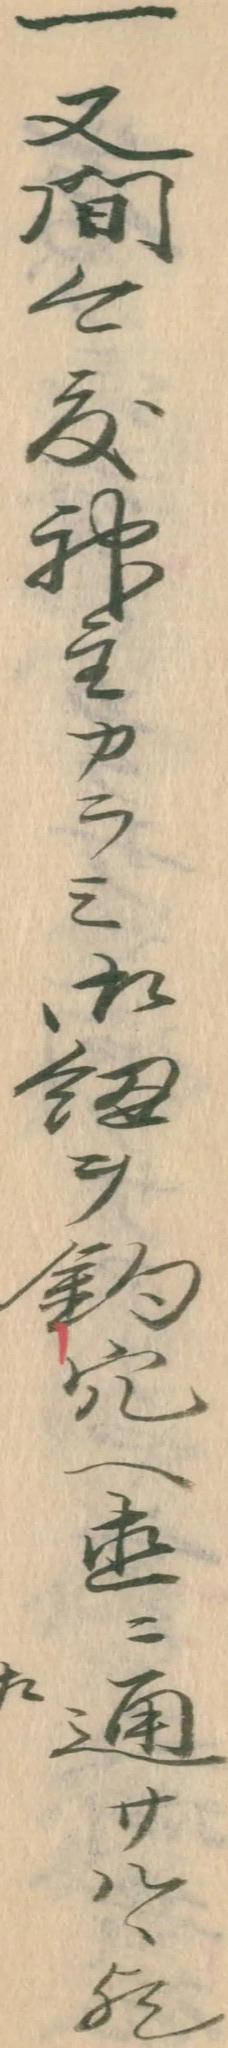一又間今度神主カラミ御紐ヲ釣_穴へ直ニ通サルヽ歟
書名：賀茂社記録. 第16冊
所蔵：国立国会図書館 National Diet Library, JAPAN
